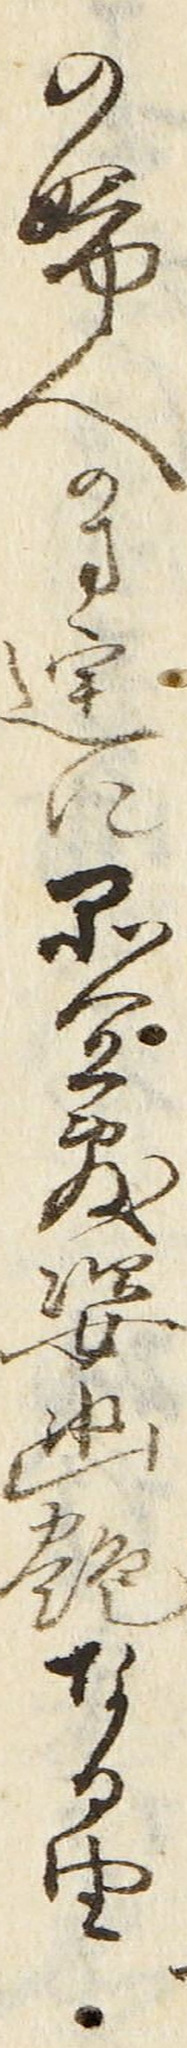の婦人の方遥に品宜敷姿幽艶なる由
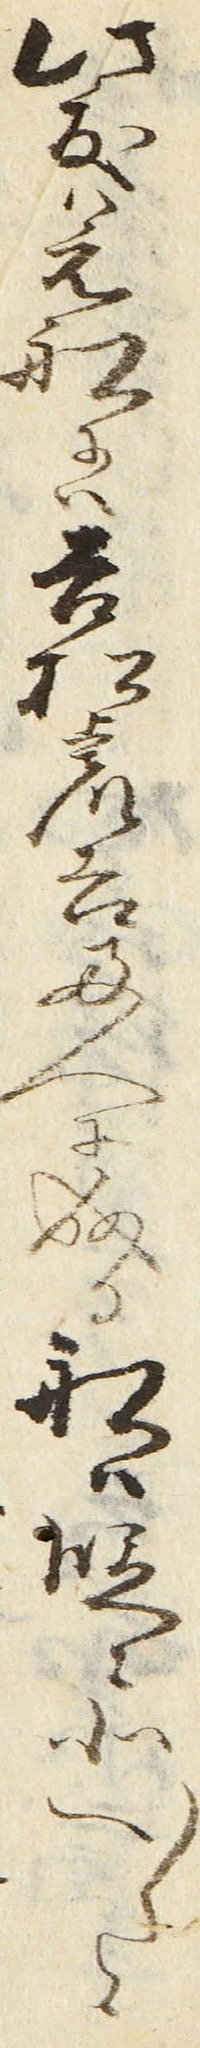此度ハ元船にハ吉松虎吉両人に成る船ハ段々北へ〳〵と
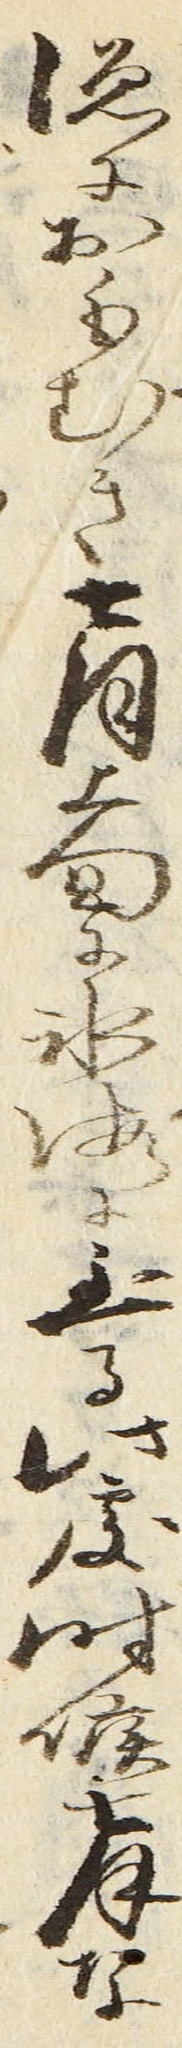漁におもむき七月上旬に氷海に至る此度時候七月な
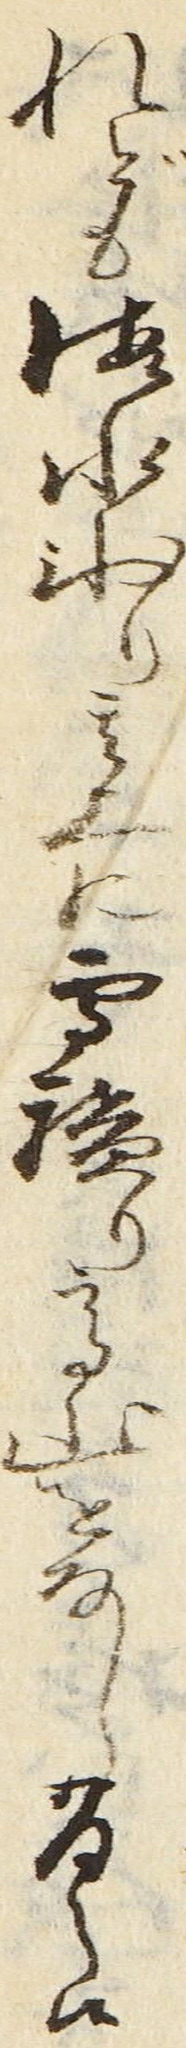れども海水氷り其上に雪積り高山をなし有し候
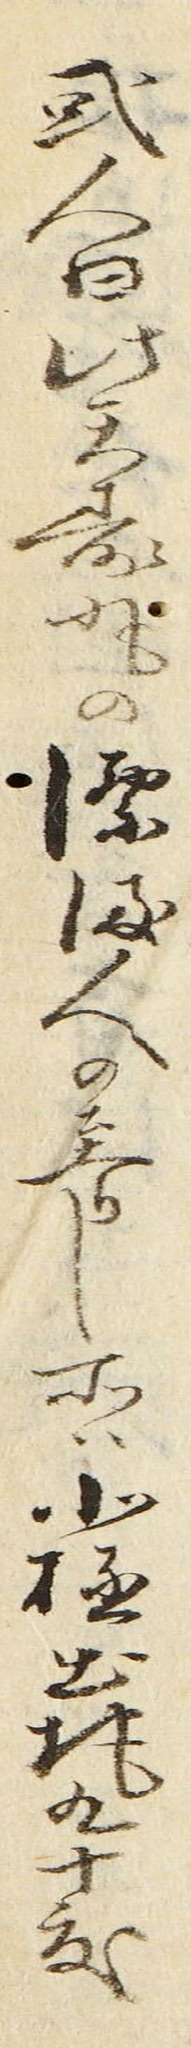或人曰此天寿丸の漂流人の至りし所ハ北極出地九十度

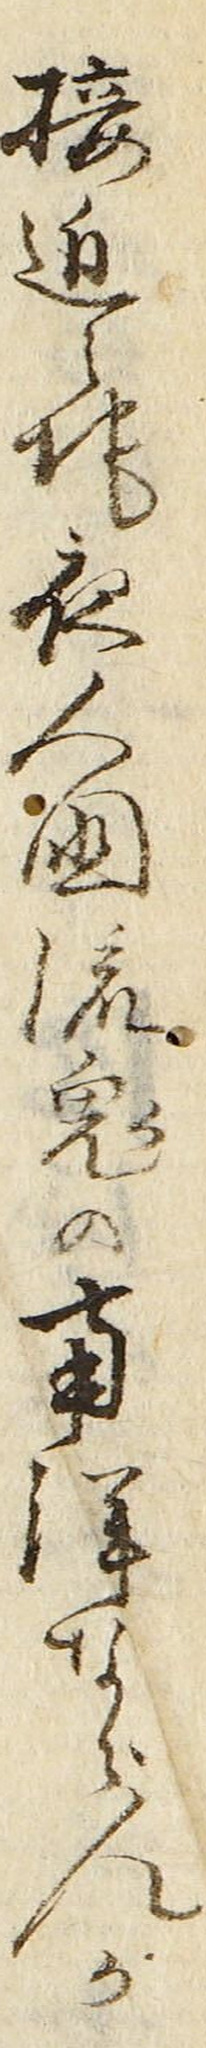接迫之地夜人国流鬼の南洋ならんか
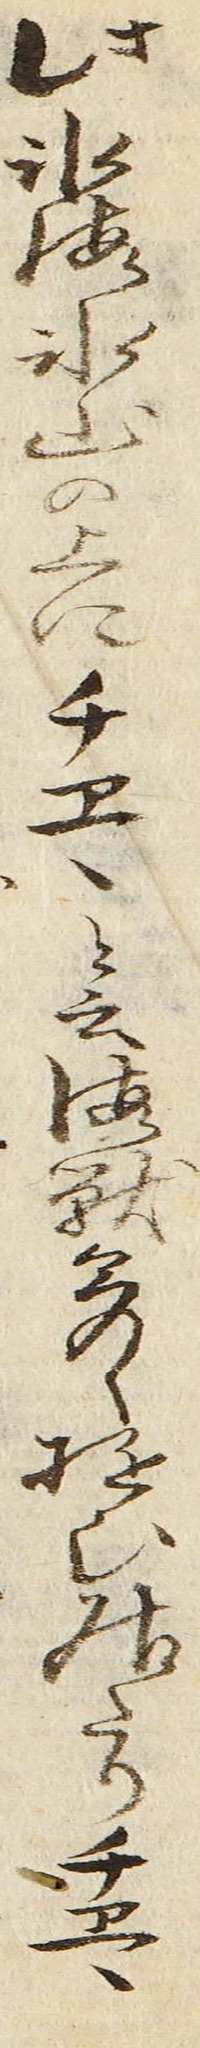此氷海氷山の上にチエヽと云海獣多く遊ひ居たりチエヽ
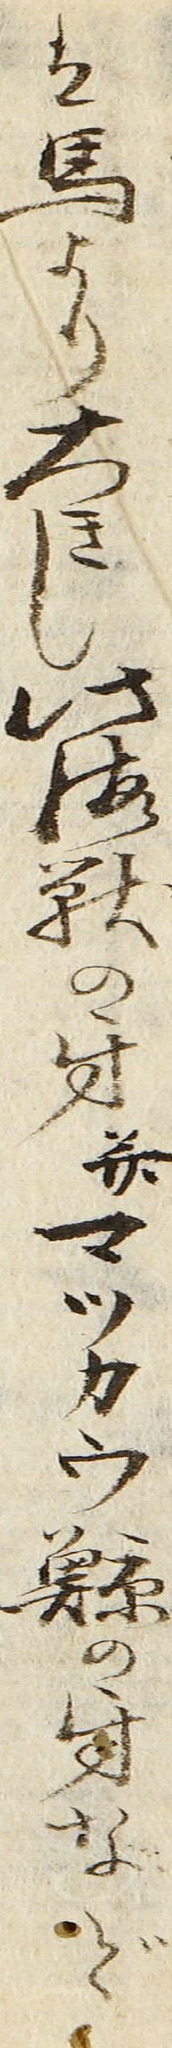は馬より大きし此海獣の身并マツカウ鯨の身など
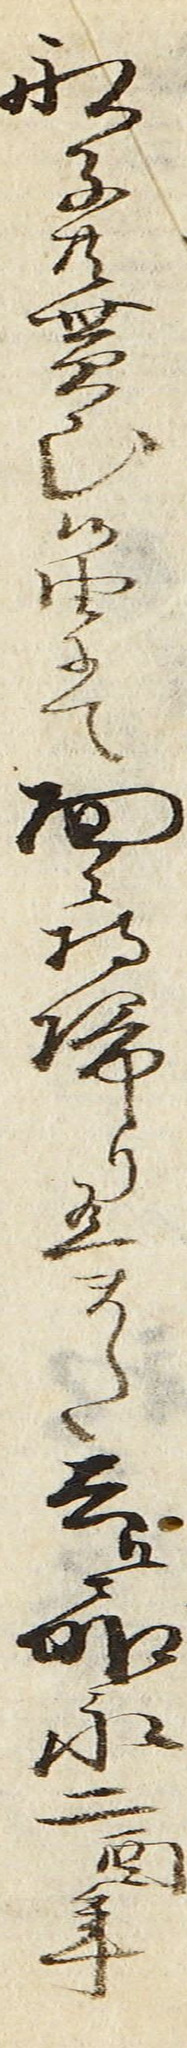船子共貰ひ候由にて面々持帰り有また去ル嘉永二酉年
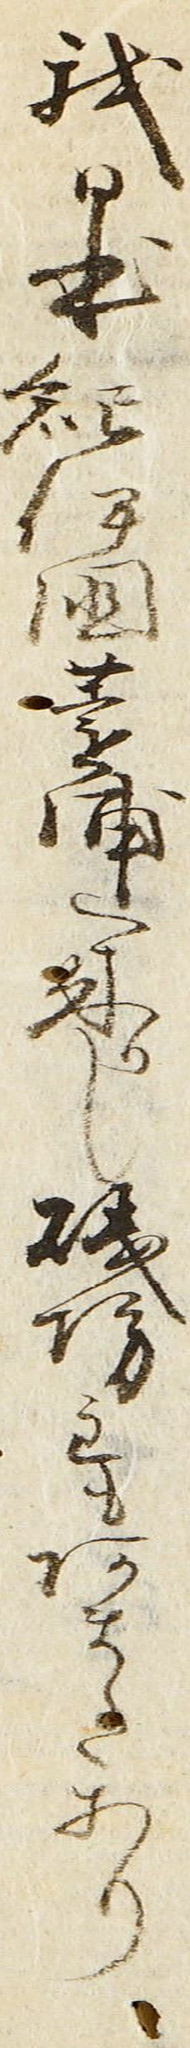我日本紀伊国薗浦へ来りし磯坊主もあまたあり
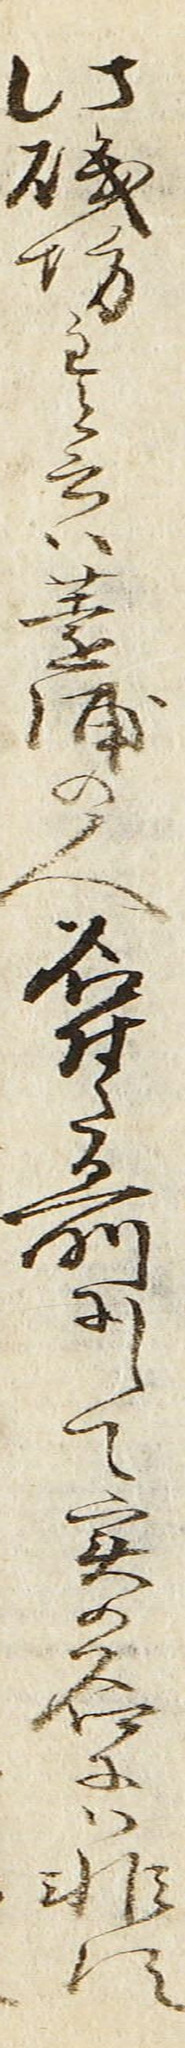此磯坊主と云ハ薗浦の人名付たる所にして実の名にハ非す
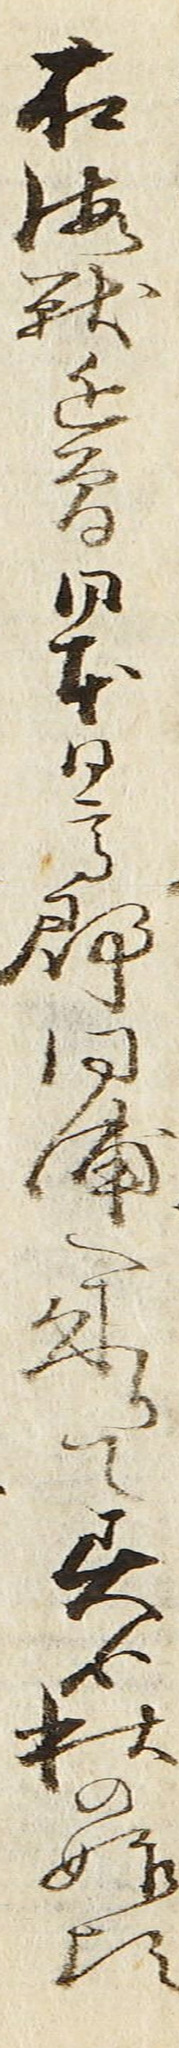右海獣近曽日本日高郡同浦へ来りて春ゟ秋の始頃
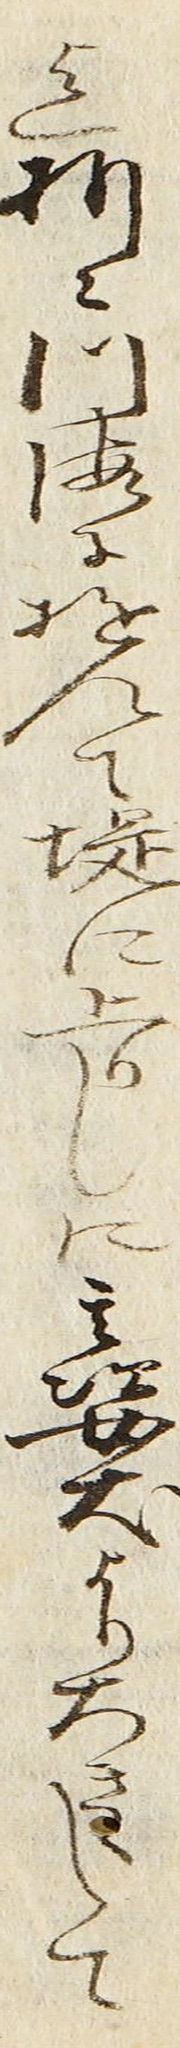迄折々川海に遊んて堤に上りしに其姿犬より大きくして
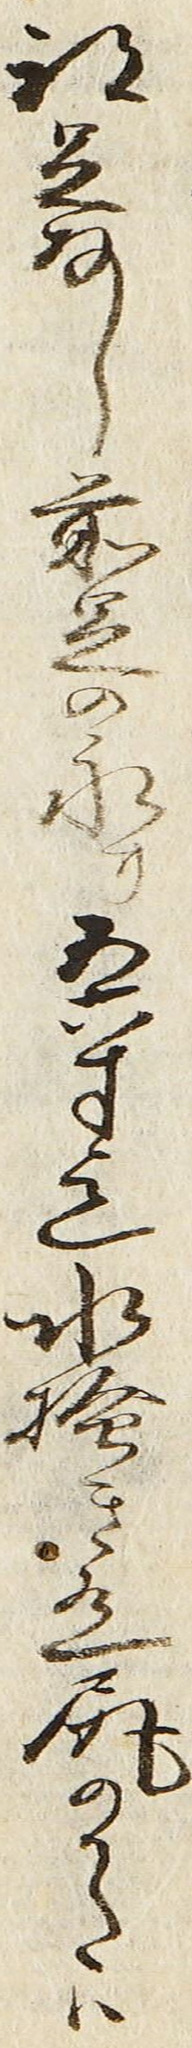跡足なし前足の永サ五六寸迄水掻き有尻のかたハ
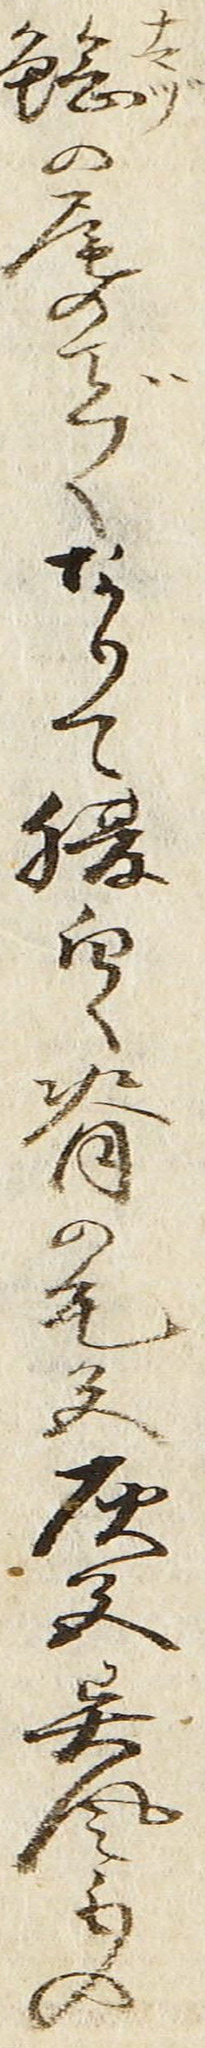鯰の尾のごとくなりて腹白く背の毛色灰色異風もの
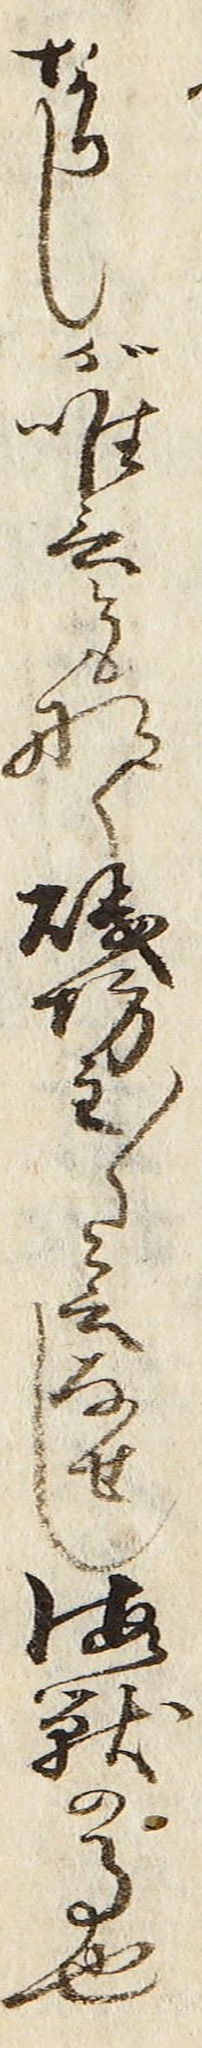なりしが唯言ともなく磯坊主〳〵と云なせし海獣之事也
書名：亜墨利加漂流記聞
